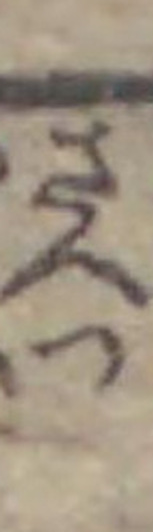さへつ
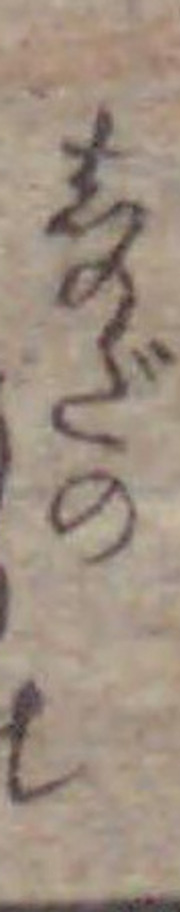しのだの
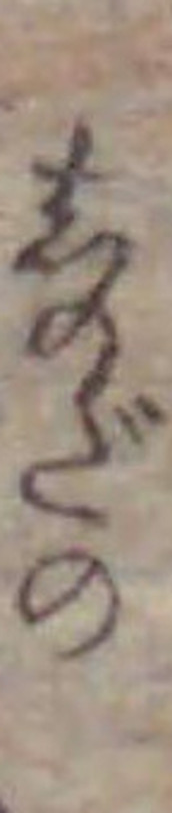しのだの
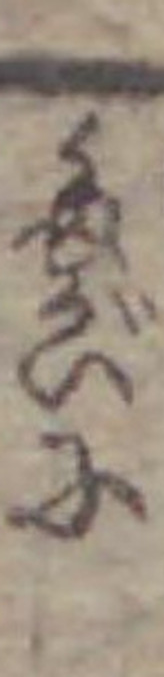たがいに
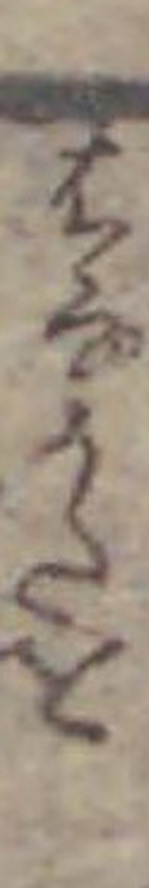はなうたを
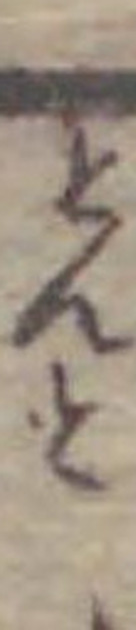とんと
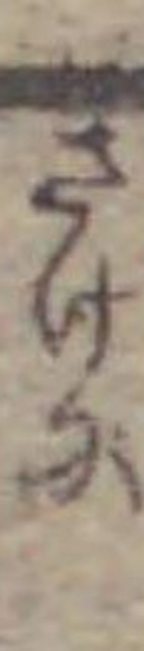さけに
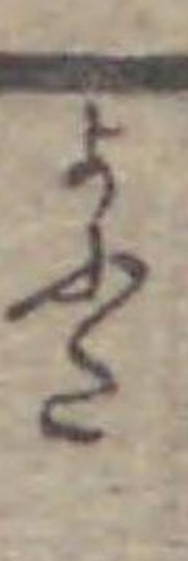よふた
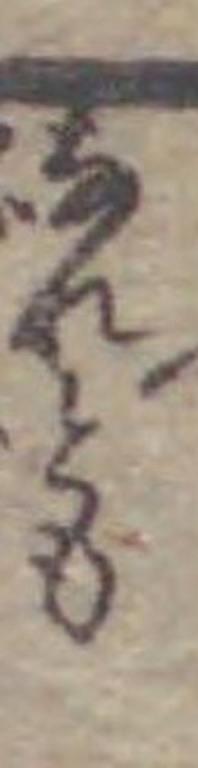なれとも
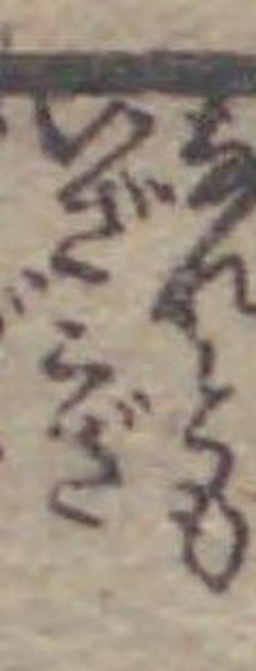いざこざ

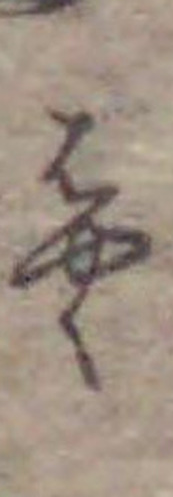はやく
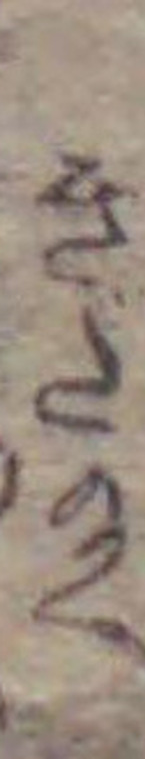きた給へ
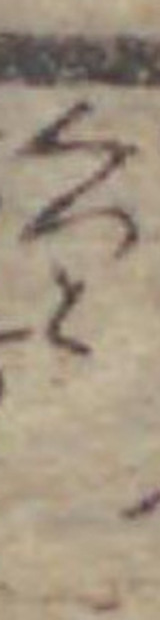くつと
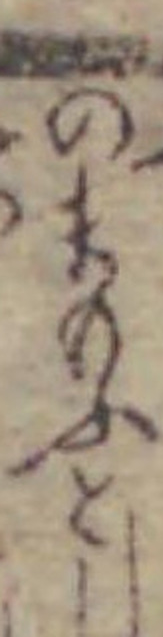のまもふと
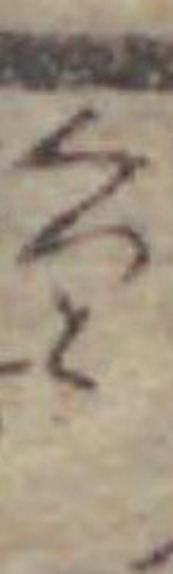くつと
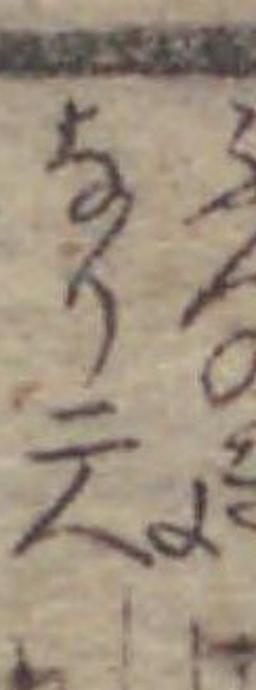なり二人
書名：見通占 : 3巻
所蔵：国立国会図書館 National Diet Library, JAPAN
